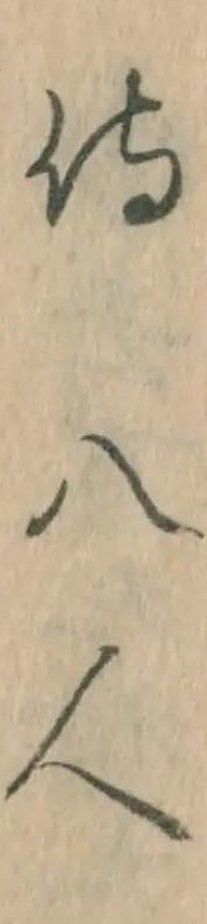侍八人

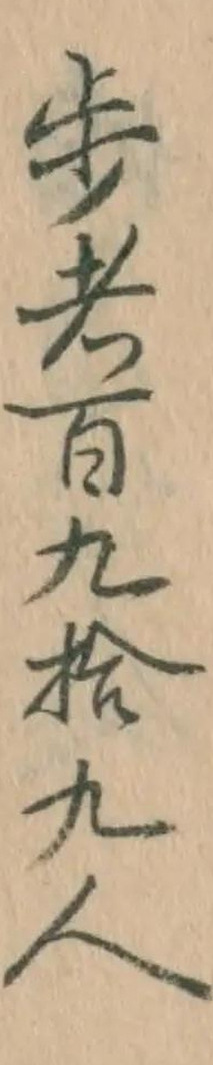歩者百九拾九人
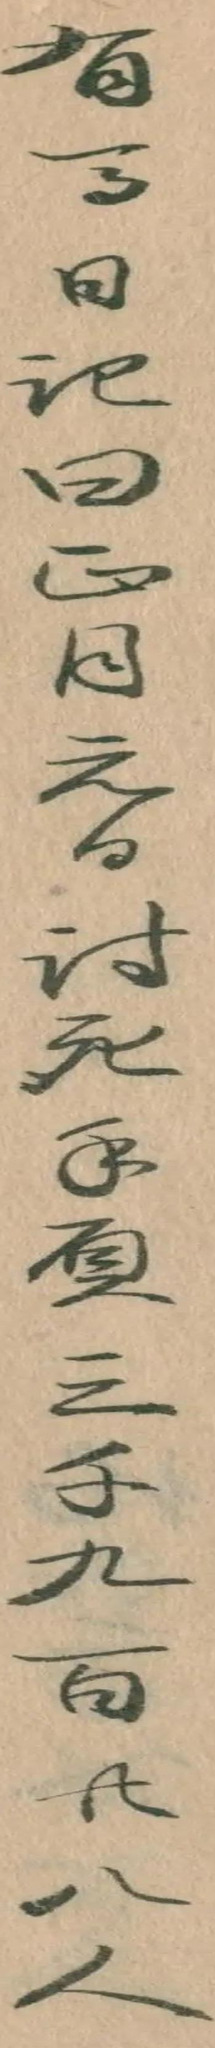有馬日記曰正月元日討死手負三千九百廿八人
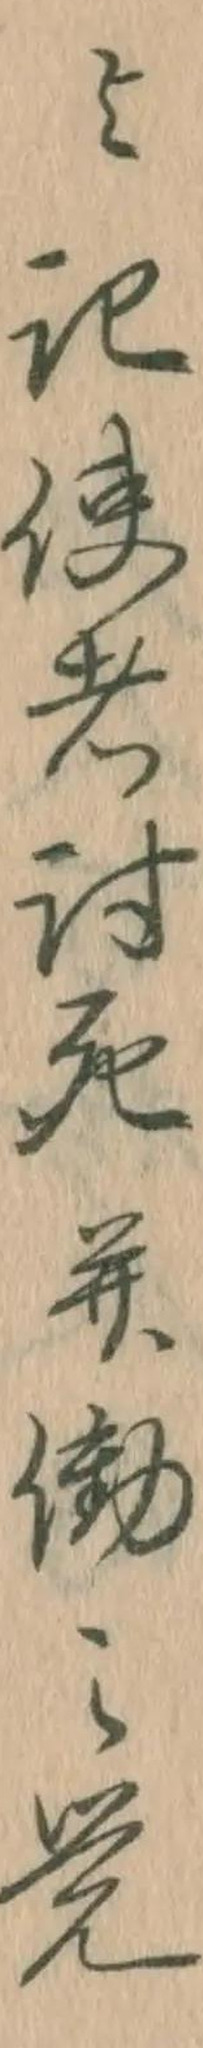与記使者討死幷働之覚
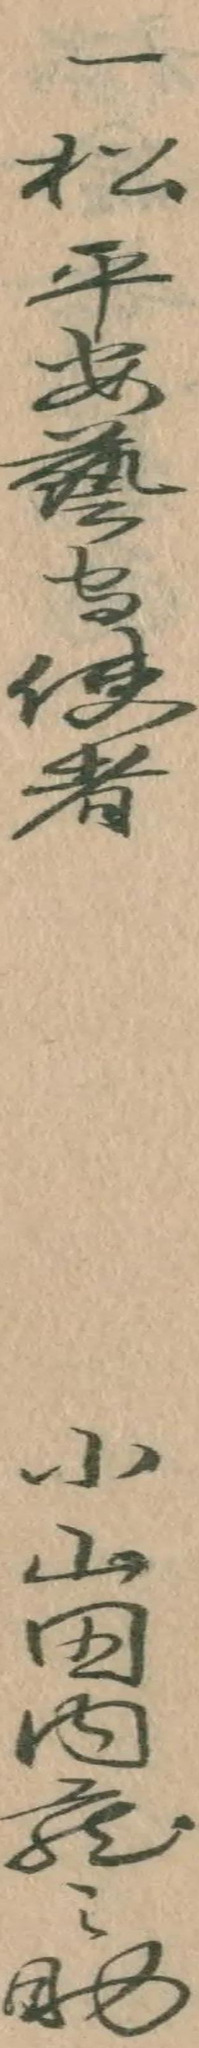一松平安芸守使者小山田内蔵之助
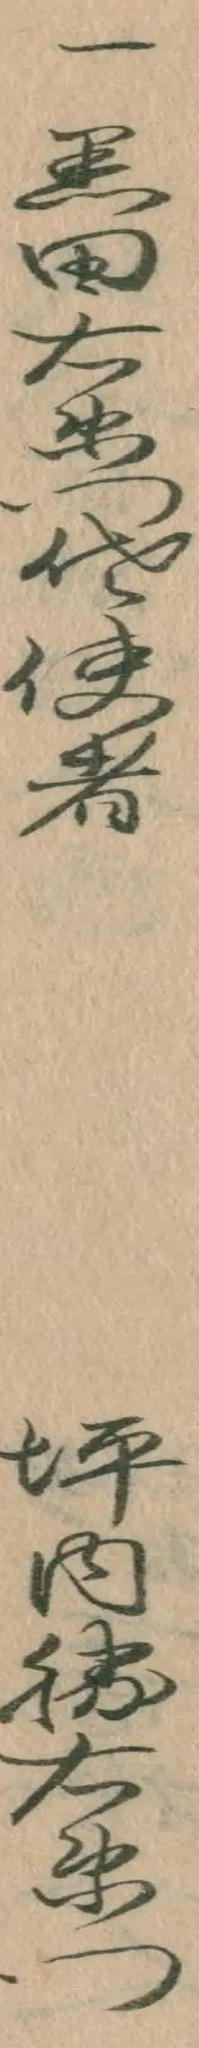一黒田右衛門佐使者坪内祥勝右衛門
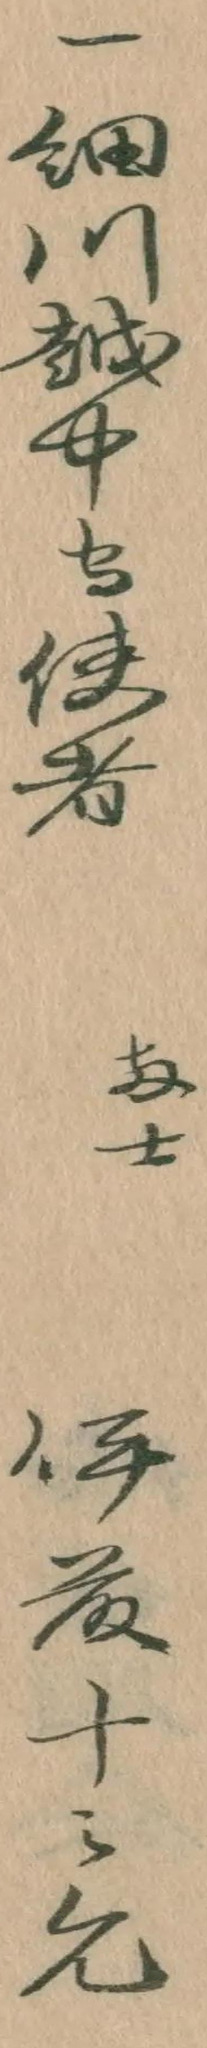一細川越中守使者両士伊藤十之允
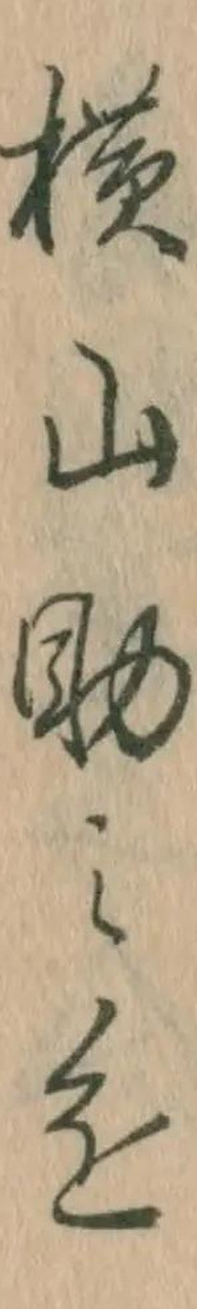横山助之進
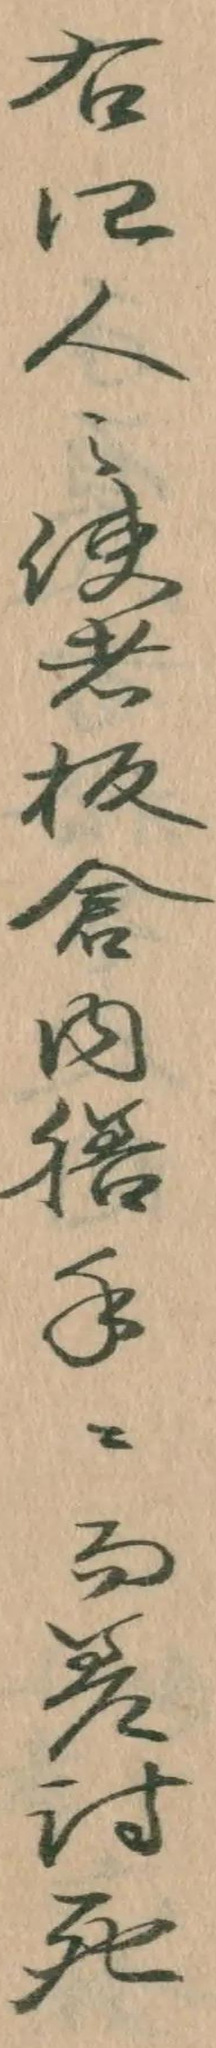右四人之使者板倉内膳手に而差討死
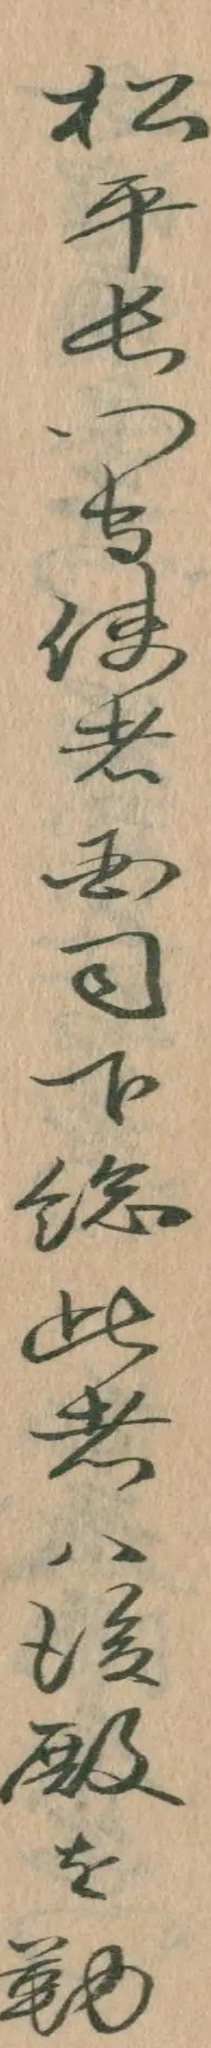一松平長門守使者国司下総此者は後殿を勤
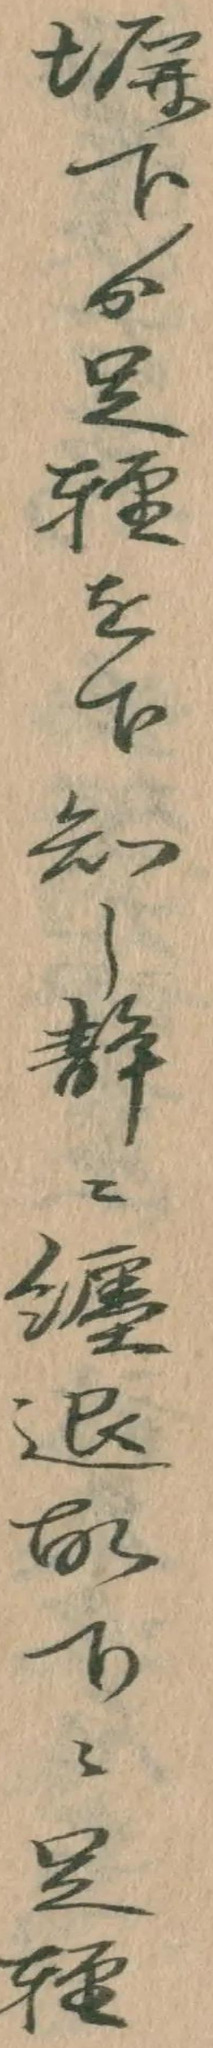塀下ゟ足軽を下知し静に纏退故下々足軽
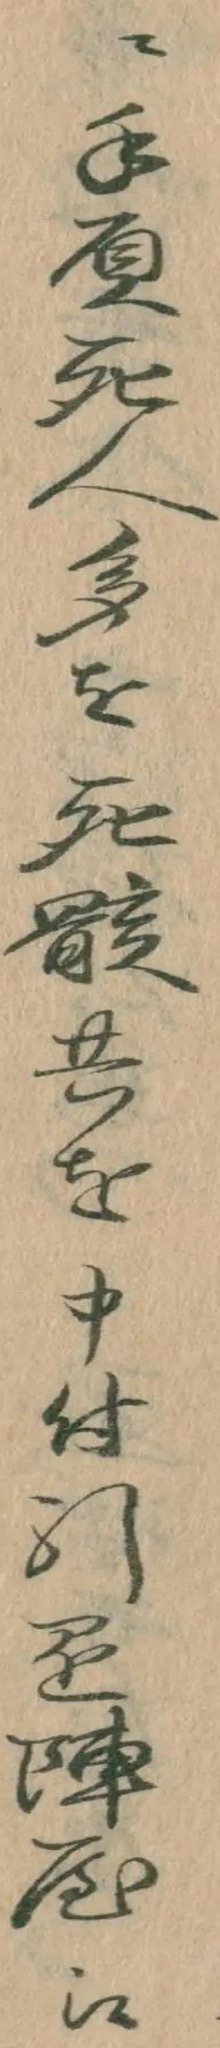に手負死人多を死骸共を申付引懸陣屋江
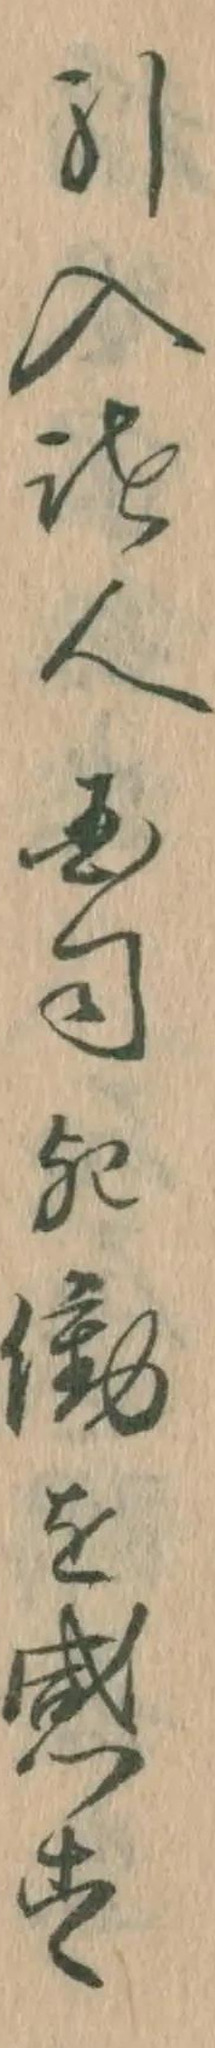引入諸人国司歟働を感春
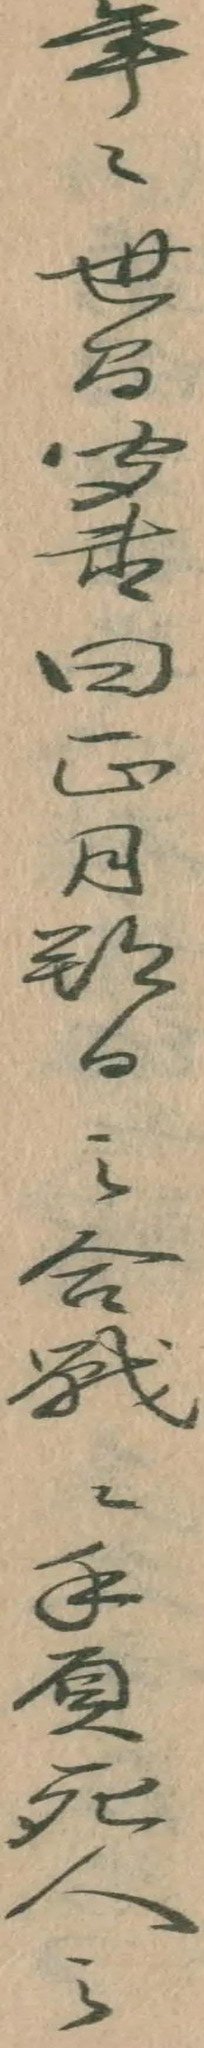年々世間聞書曰正月朔日之合戦に手負死人之
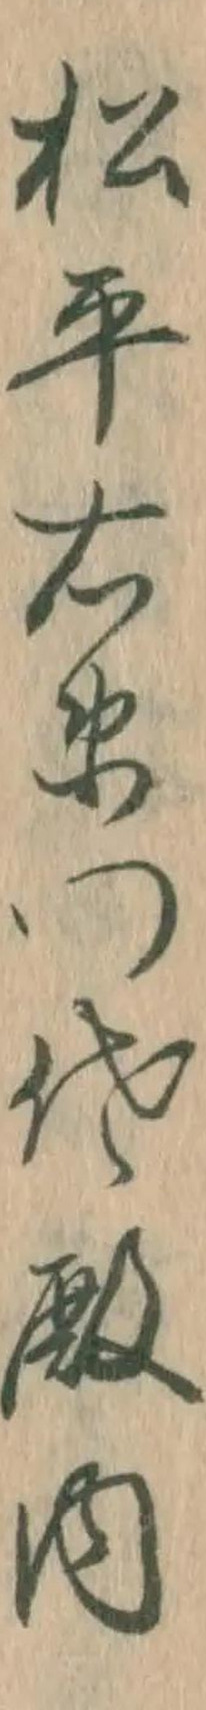松平右衛門佐殿内
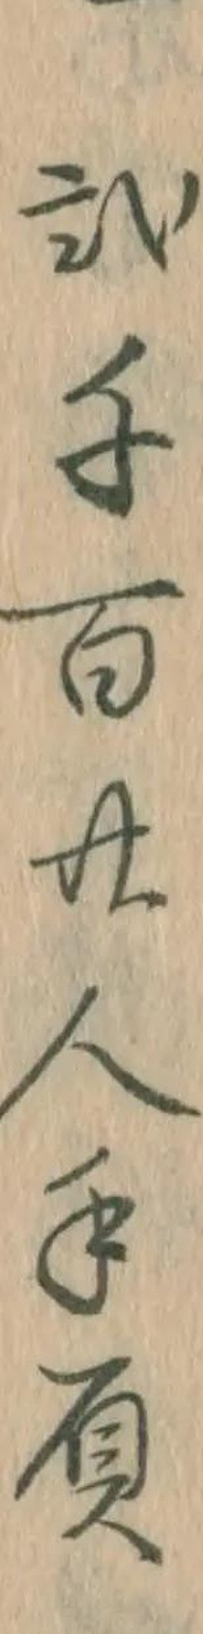一弐千百廿人手負
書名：切支丹御退治記 49巻. [5]
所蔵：国立国会図書館 National Diet Library, JAPAN
